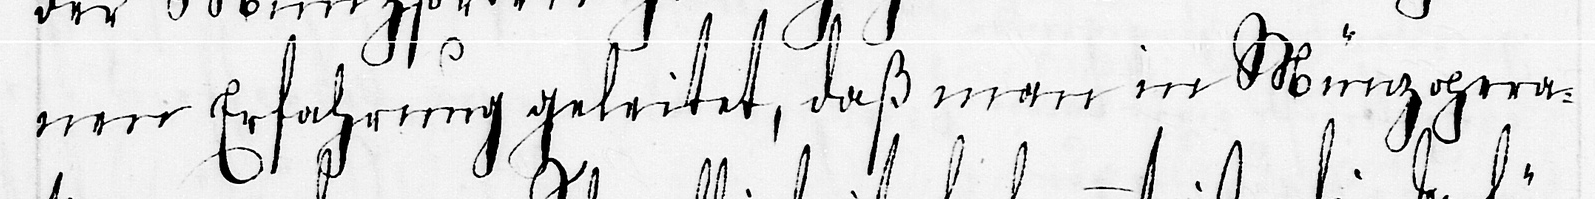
nen Erfahrung geleitet, daß man in Münzopera¬
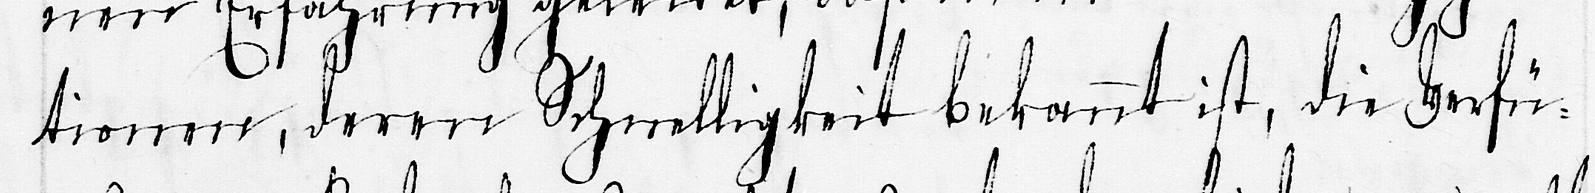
tionen, deren Schnelligkeit bekannt ist, die Verfü¬
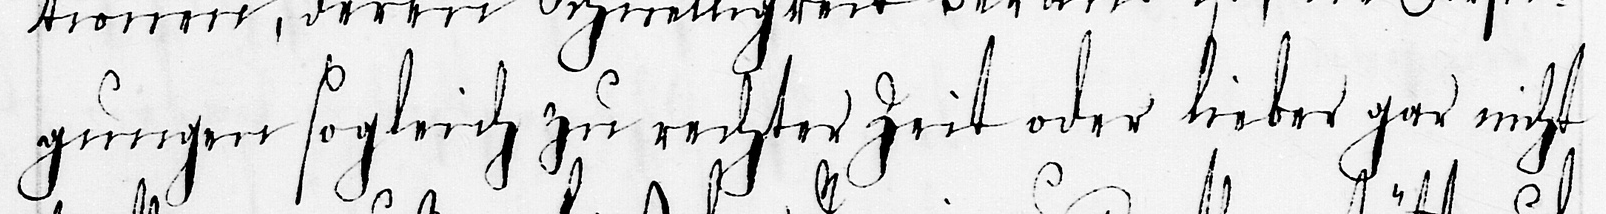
gungen sogleich zu rechter Zeit oder lieber gar nicht
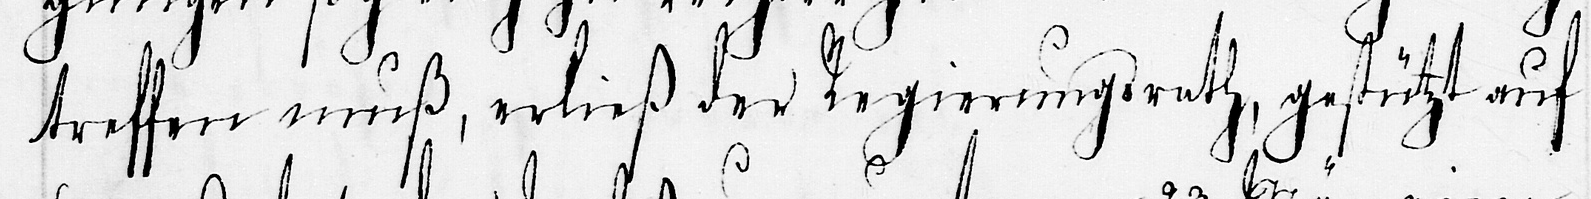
treffen muß, erließ der Regierungsrath, gestützt auf
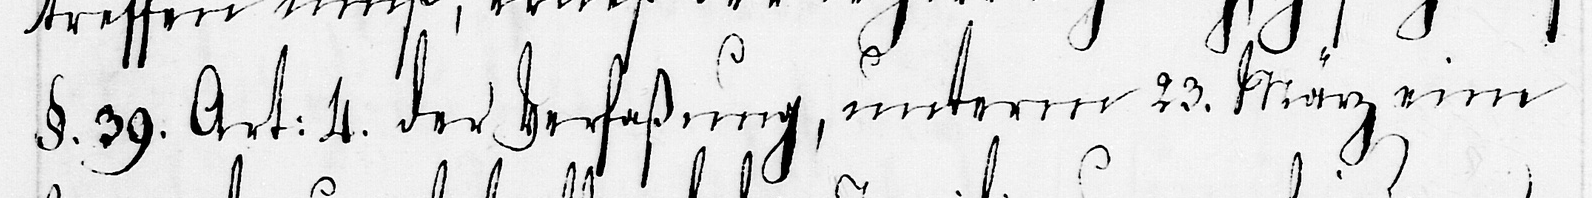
§. 39. Art: 4. der Verfaßung, unterm 23. März eine
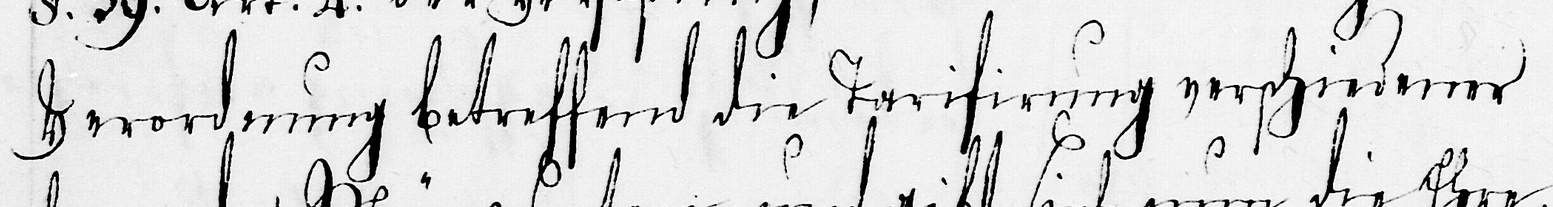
Verordnung betreffend die Tarifirung verschiedener
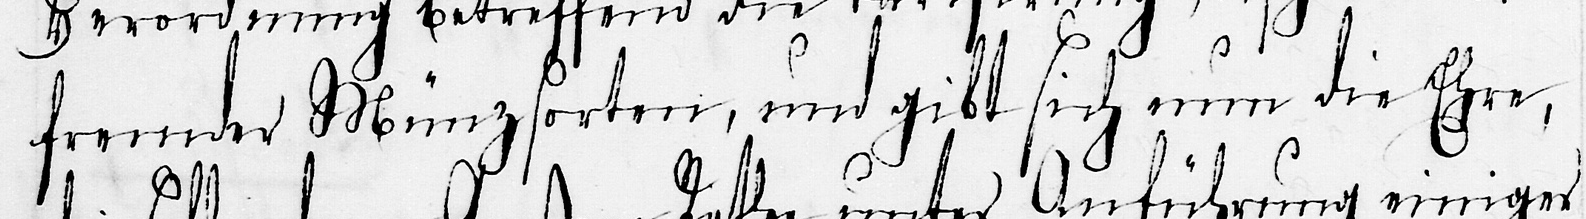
fremder Münzsorten, und gibt sich nun die Ehre,
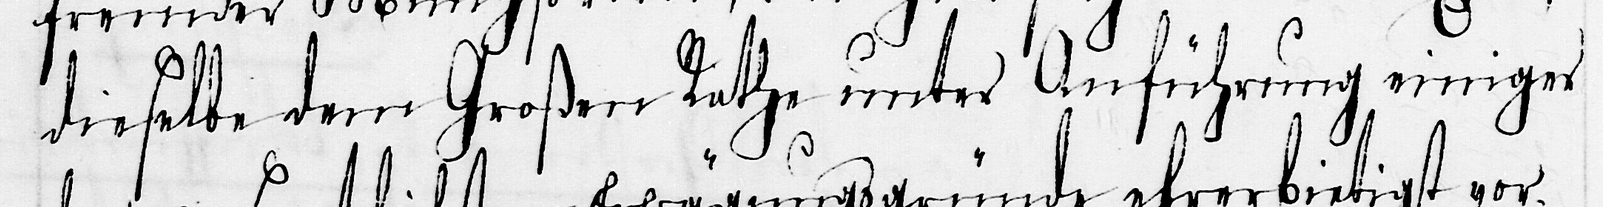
dieselbe dem Großen Rathe unter Anführung einiger
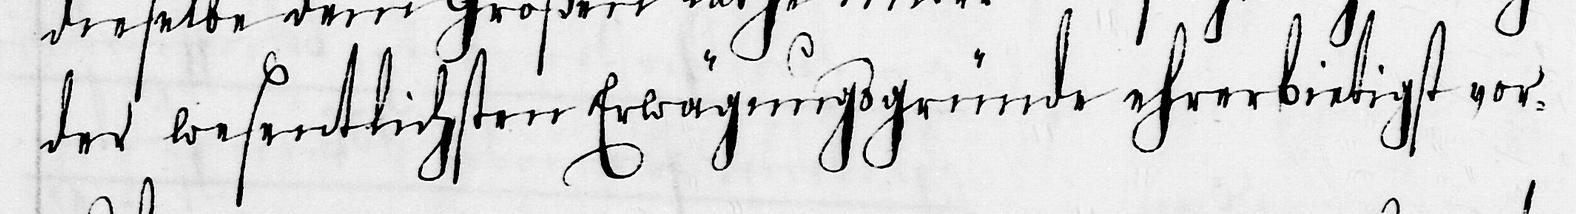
der wesentlichsten Erwägungsgründe ehrerbietigst vor¬
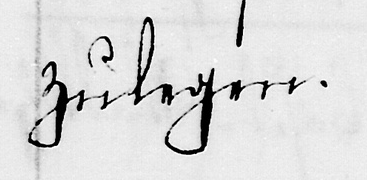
zulegen.
